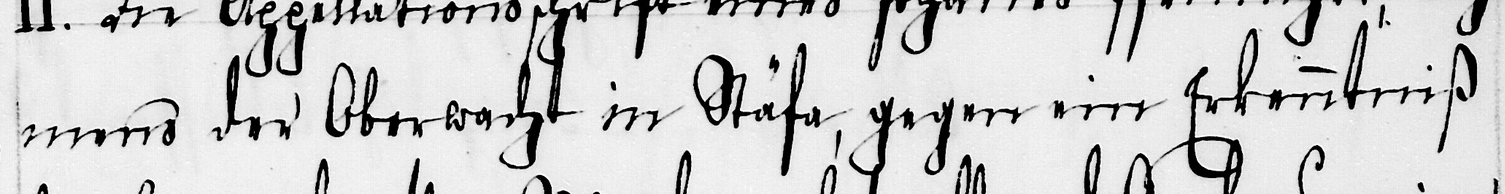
mens der Oberwacht in Stäfa, gegen ein Erkenntniß
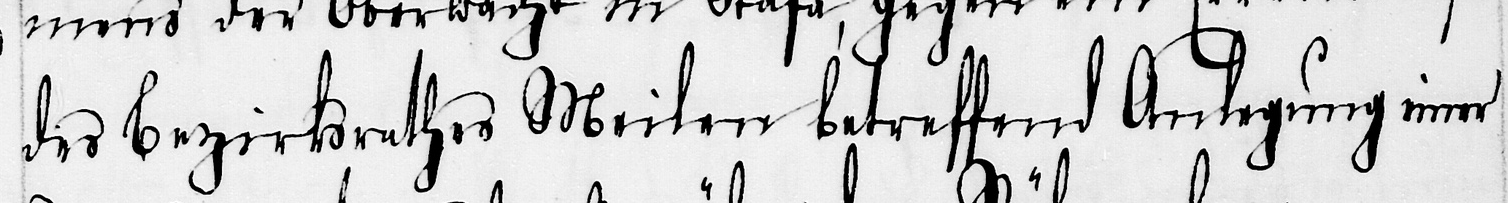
des Bezirksrathes Meilen betreffend Anlegung einer
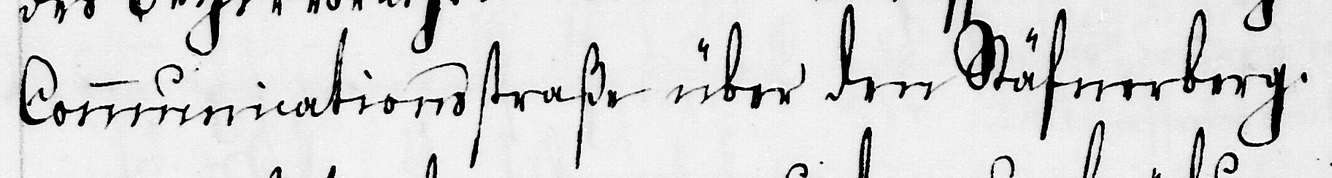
Communicationsstraße über den Stäfnerberg.
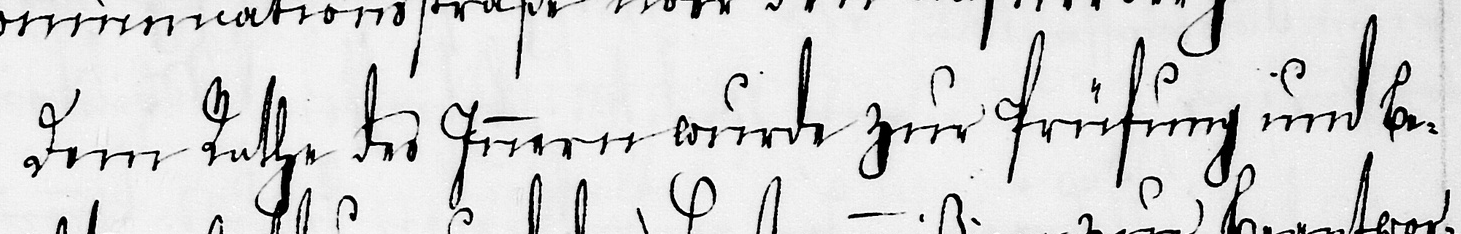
Dem Rathe des Innern wurde zur Prüfung und Be¬
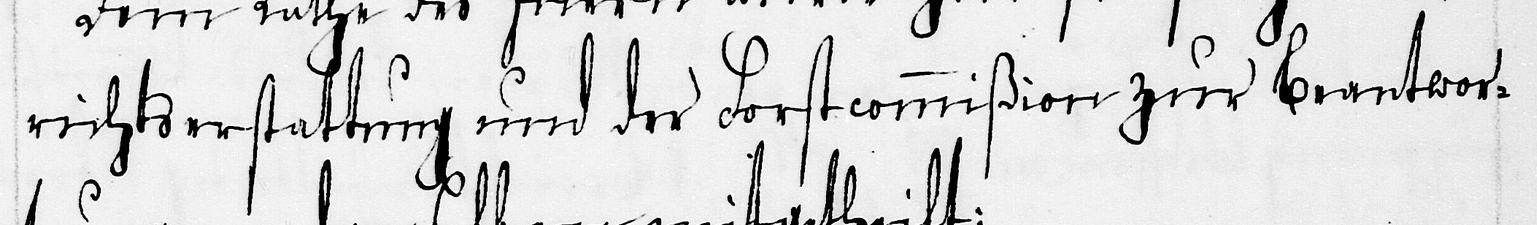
richtserstattung und der Forstcommißion zur Beantwor¬
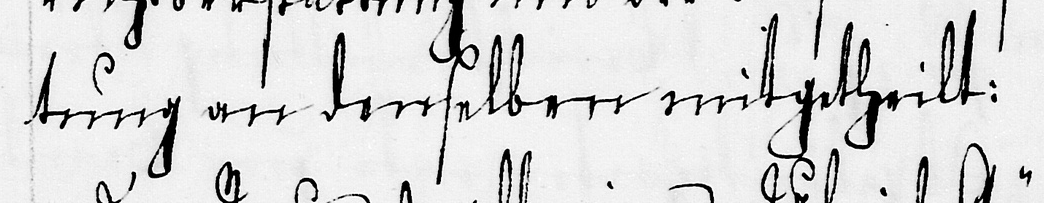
tung an denselben mitgetheilt:
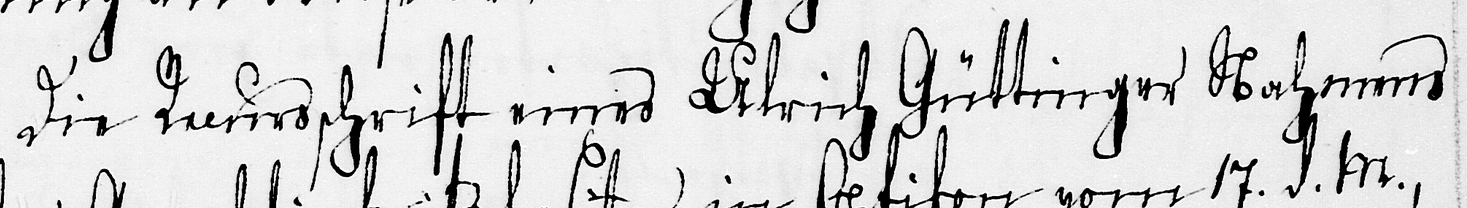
Die Recursschrift eines Ulrich Güttinger Nahmens
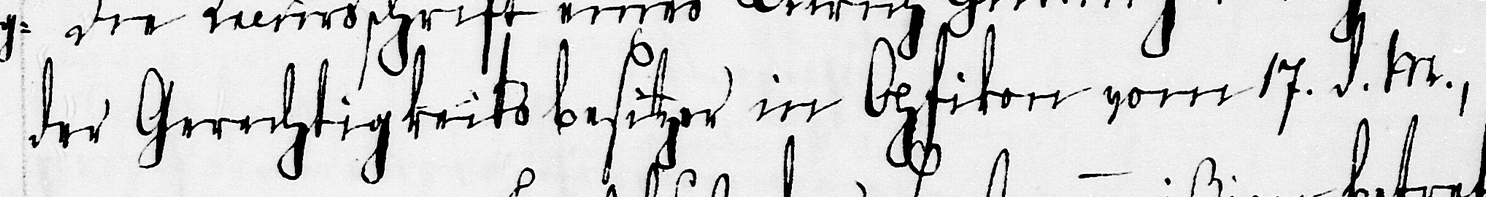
der Gerechtigkeitsbesitzer in Opfikon vom 17. d. M.,
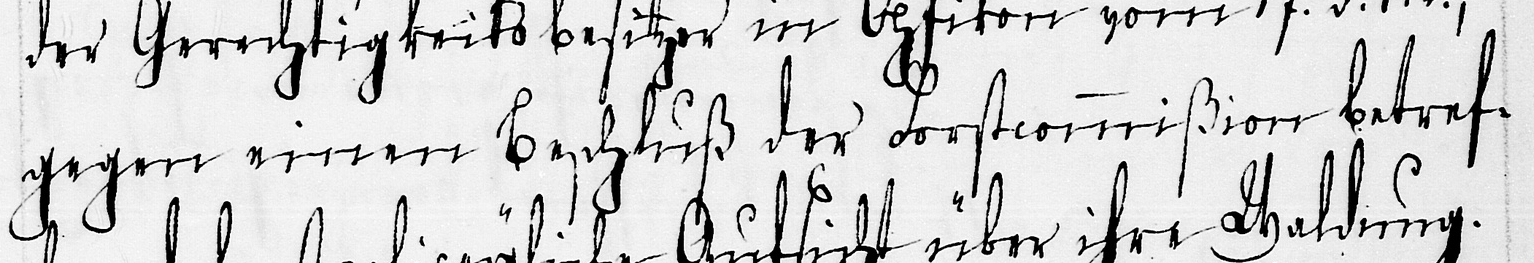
gegen einen Beschluß der Forstcommißion betref¬
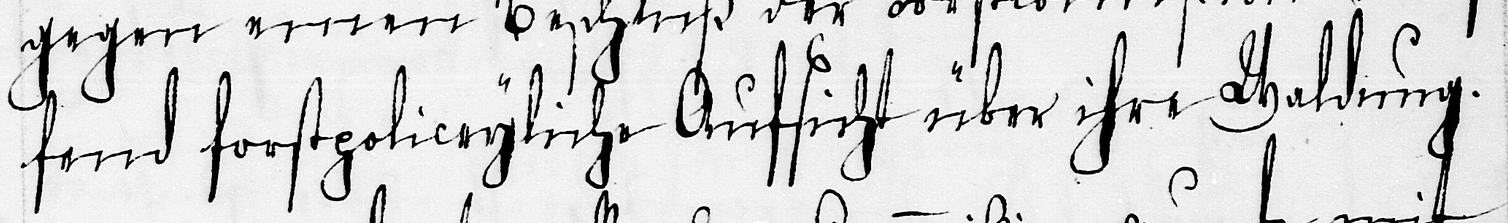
fend forstpoliceyliche Aufsicht über ihre Waldung.
